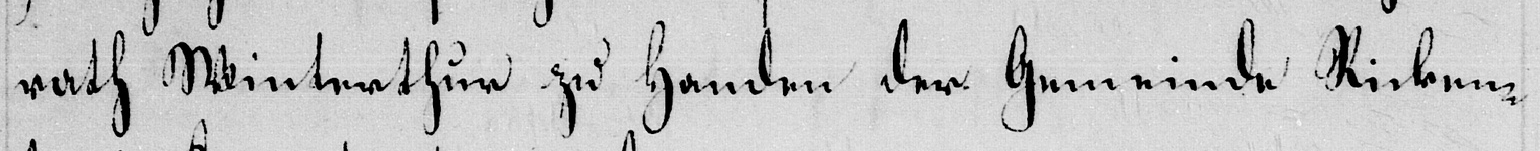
rath Winterthur zu Handen der Gemeinde Ricken¬
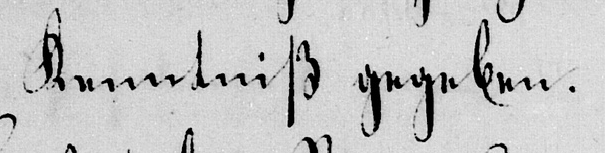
Kenntniß gegeben.
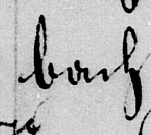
bach
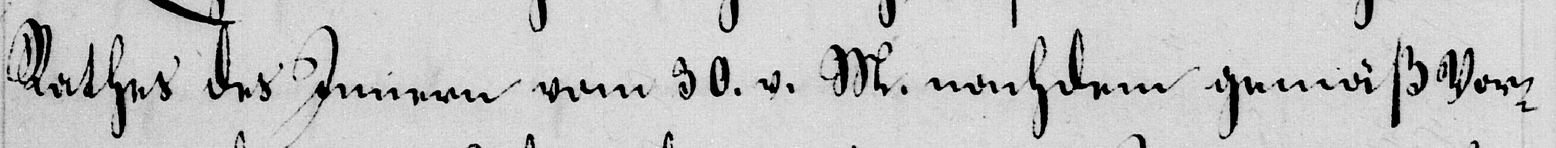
Rathes des Innern vom 30. v. M. nachdem gemäß Vor¬
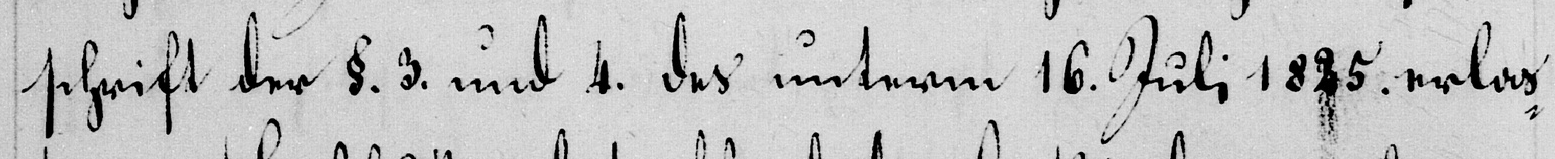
schrift der §. 3. und 4. des unterm 16. Juli 1825. erla¬
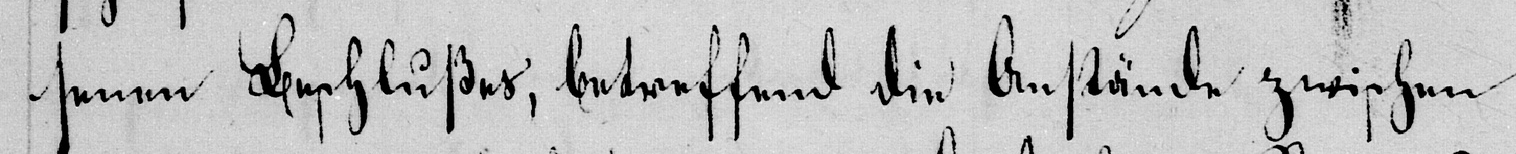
ßenen Beschlußes, betreffend die Anstände zwischen
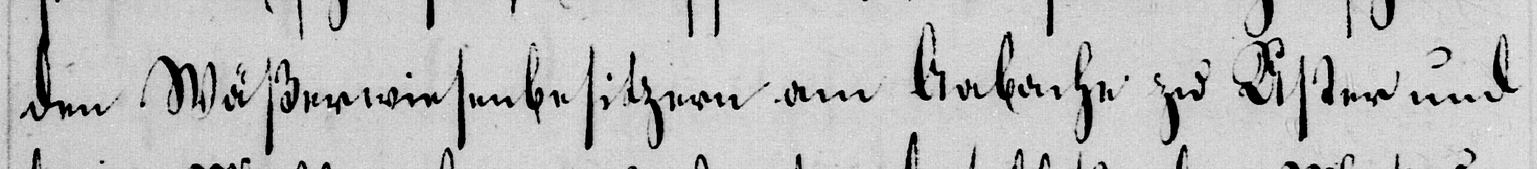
den Wäßerwiesenbesitzer am Aabache zu Uster und
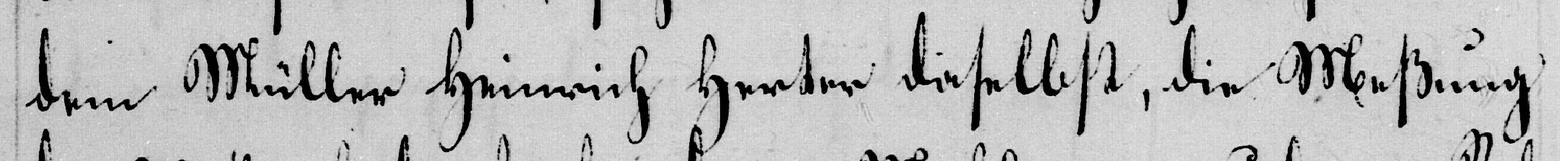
dem Müller Heinrich Herter daselbst, die Meßung
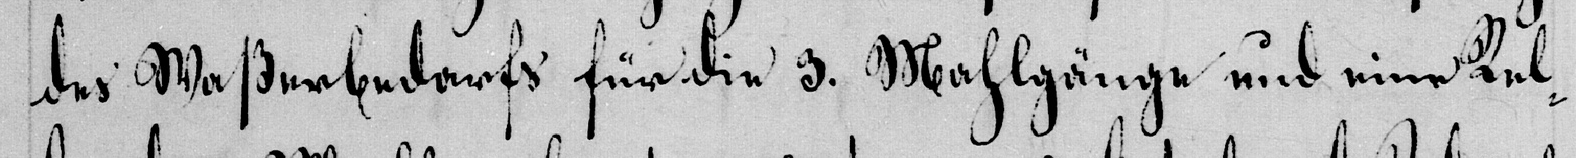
des Waßerbedarfs für die 3. Mahlgänge und eine Rel¬
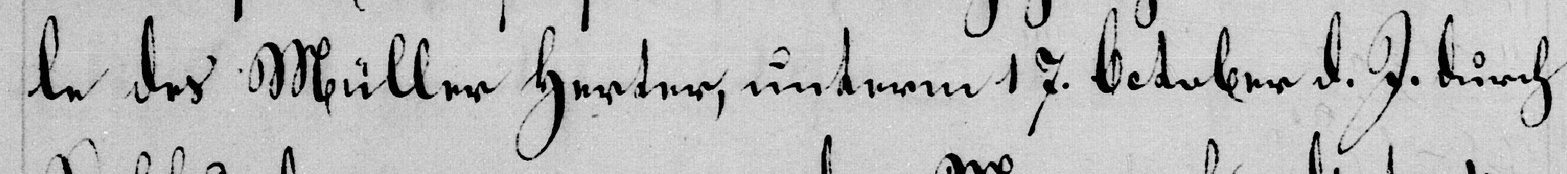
le des Müller Herter, unterm 17. October d. J. durch
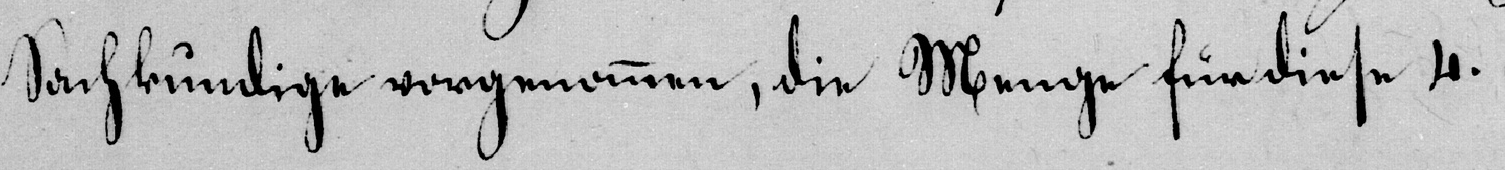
Sachkundige vorgenommen, die Menge für diese 4.
